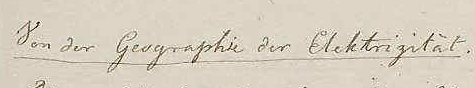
Von der Geographie der Elektrizität.
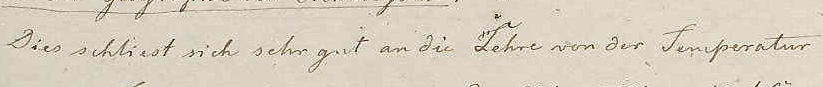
Dies schliest sich sehr gut an die TLehre von der Temperatur
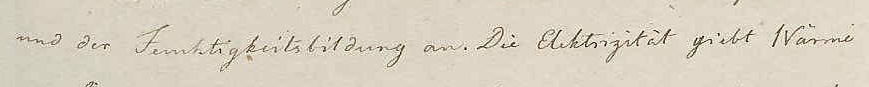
und der Feuchtigkeitsbildung an. Die Elektrizität giebt Wärme
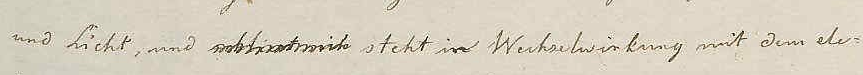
und Licht, und steht in Wechselwirkung mit dem ele-
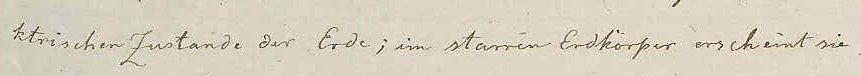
ktrischen Zustande der Erde; im starren Erdkörper erscheint sie
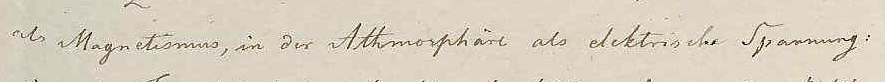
als Magnetismus, in der Athmosphäre als elektrische Spannung:
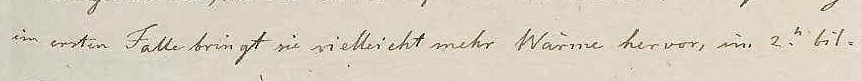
im ersten Falle bringt sie vielleicht mehr Wärme hervor, im 2￼ bil-
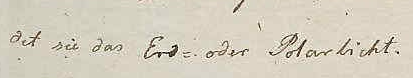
det sie das Erd- oder Polarlicht.
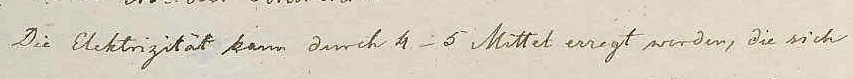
Die Elektrizität kann durch 4–5 Mittel erregt werden, die sich
